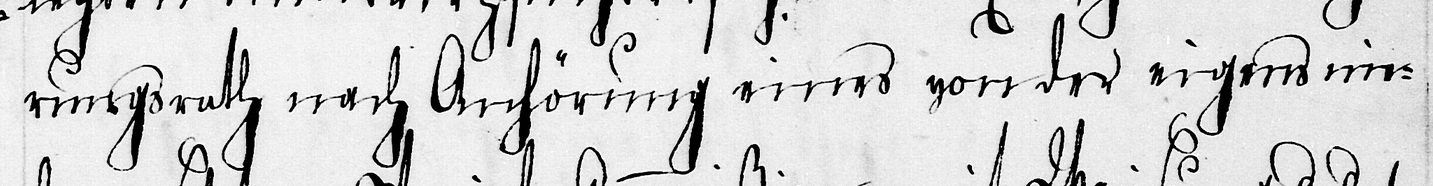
rungsrath nach Anhörung eines von der eigens nie¬
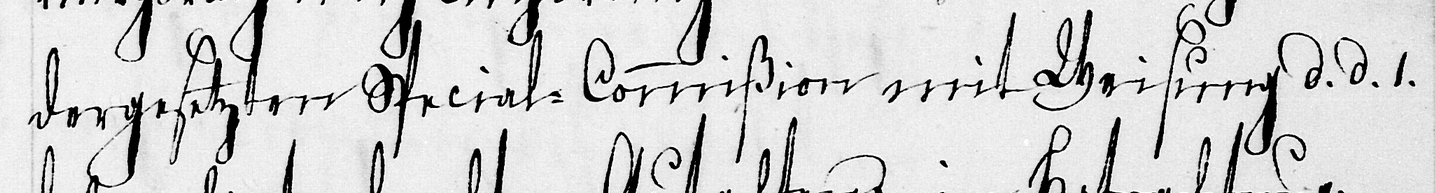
dergesetzten Special-Commißion mit Weisung d. d. 1.
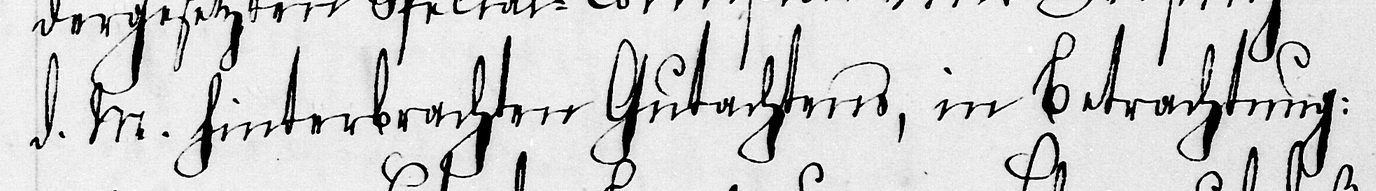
d. M. hinterbrachten Gutachtens, in Betrachtung:
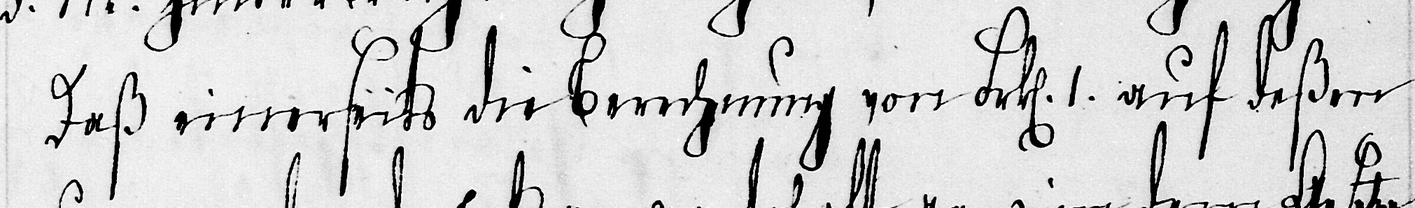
Daß einerseits die Berechnung von Frk[en]. 1. auf deßen
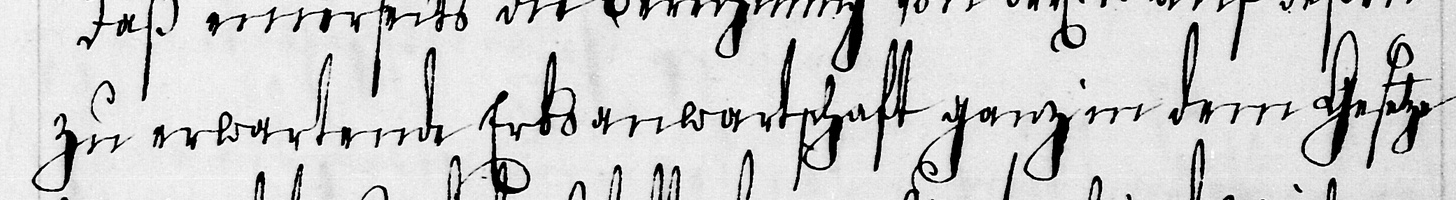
zu erwartende Erbsanwartschaft ganz in dem Gesetze
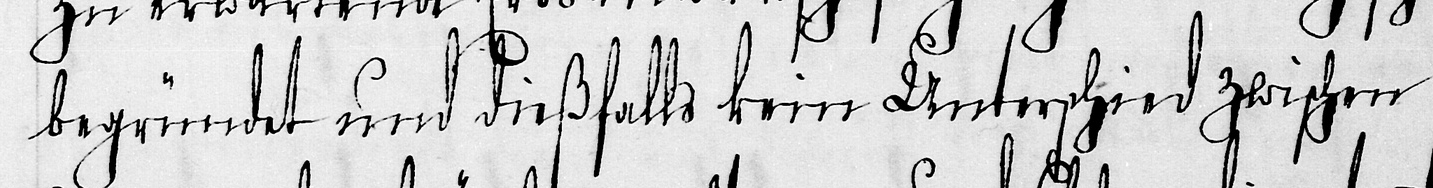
begründet und dießfalls kein Unterschied zwischen
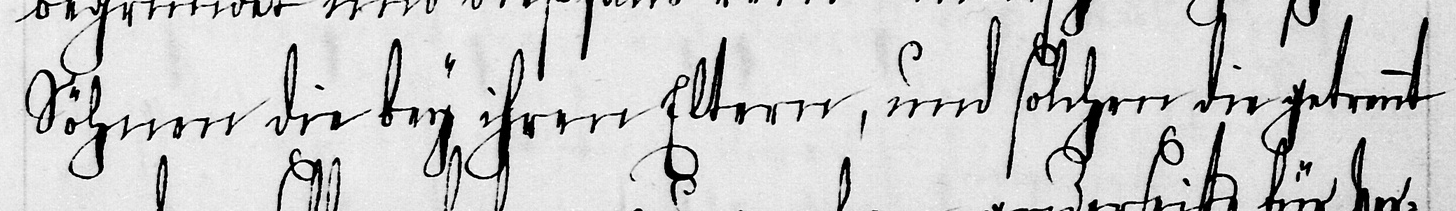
Söhnen die bey ihren Eltern, und solchen die getren¬
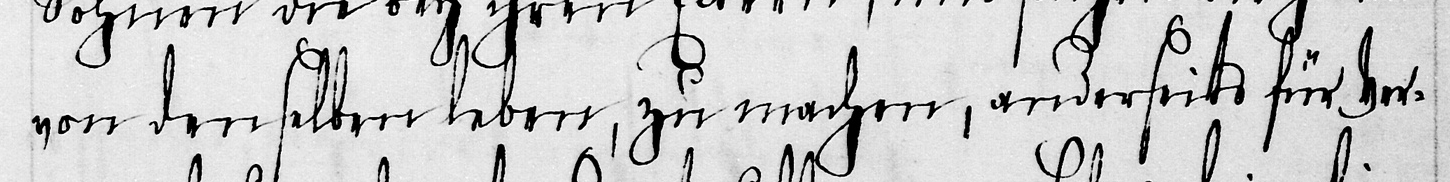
von denselben leben, zu machen, anderseits für Ver¬
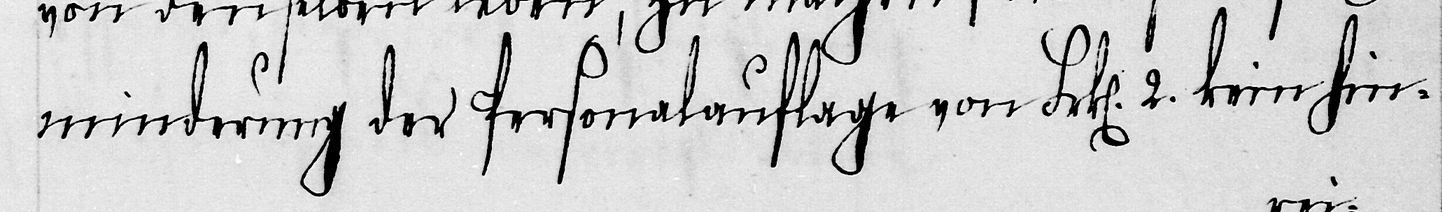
minderung der Personalauflage von Frk[en]. 2. kein
